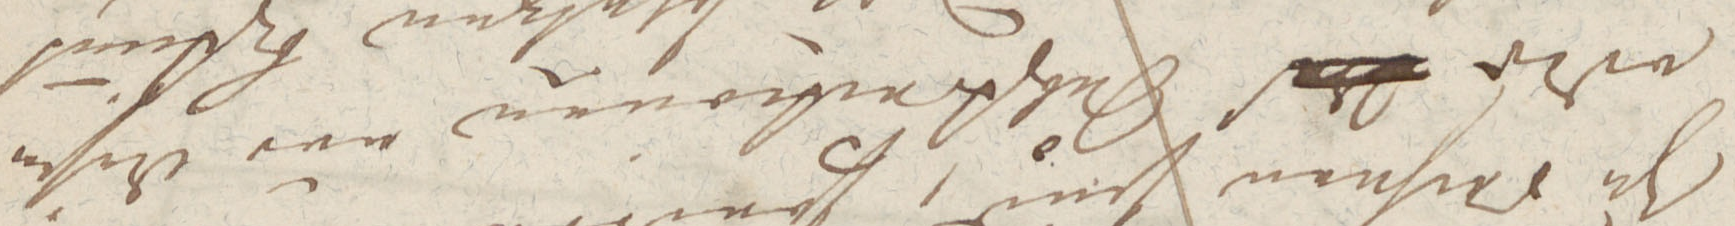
einigen Nachrichten in gleicher Weise
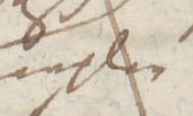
sehen
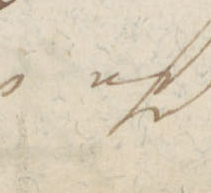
boten.
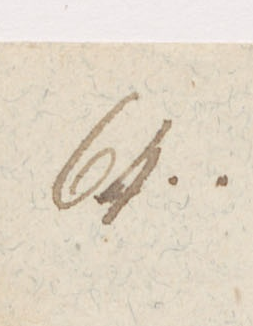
%
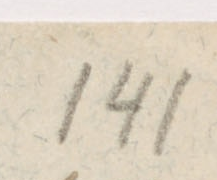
141
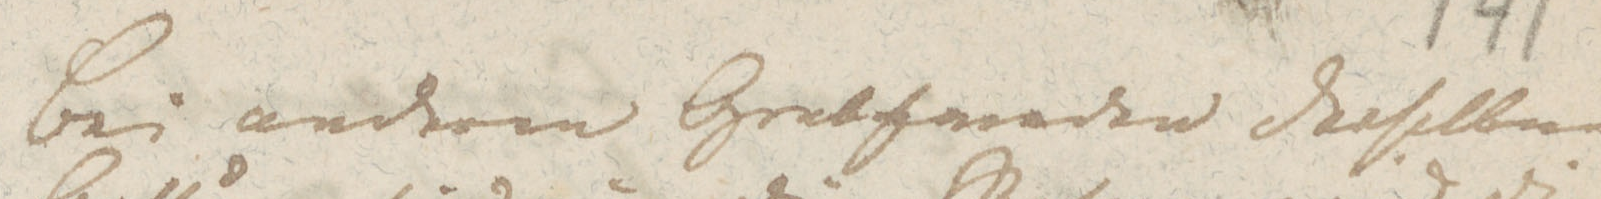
Bei anderen Grabfacaden derselben
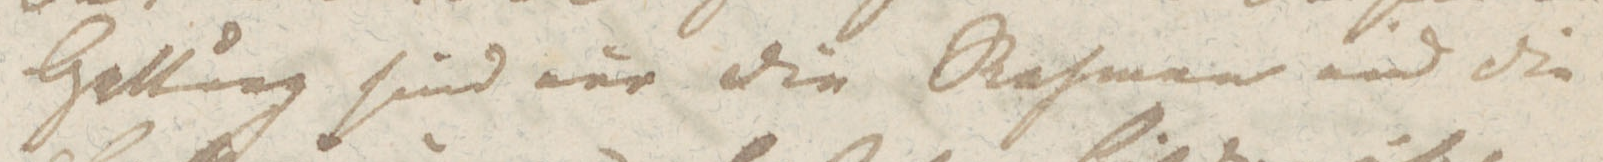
Gattung sind nur die Rahmen und die
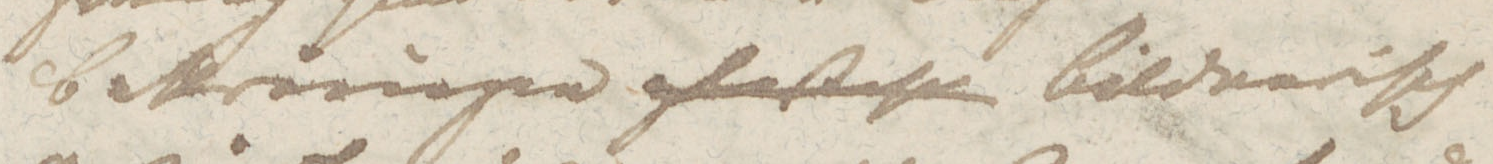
Bekrönungen plastisc bildnerisch
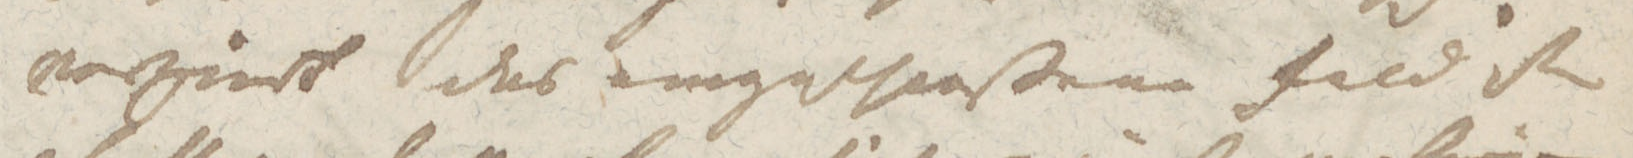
verziert das eingeschlossene Feld ist
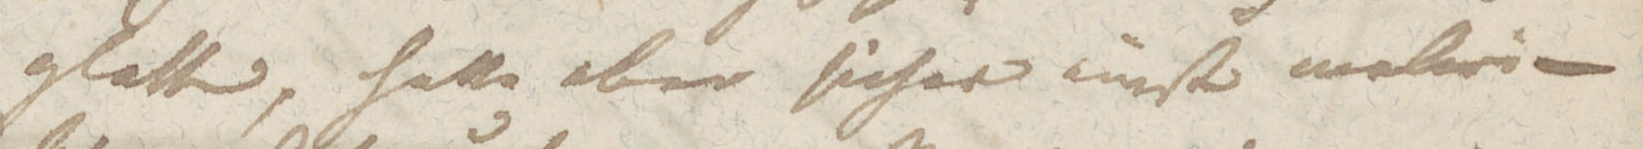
glatt, hatte aber sicher einst maleri-
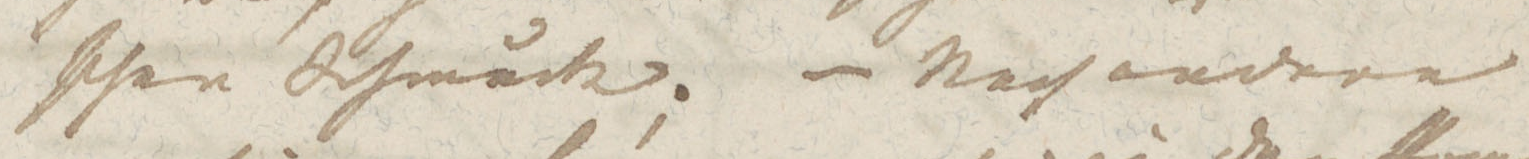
schen Schmuck; – Noch andere
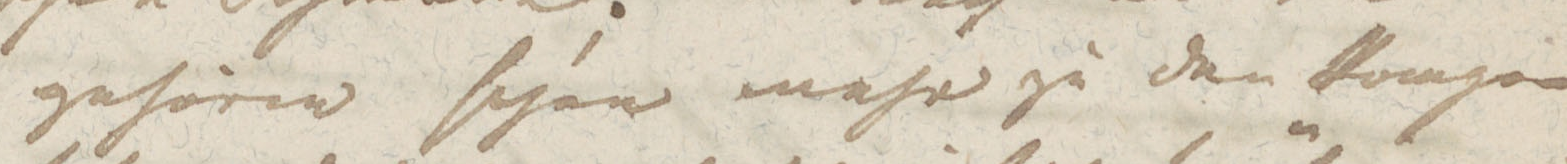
gehören schon mehr zu den kompo-
